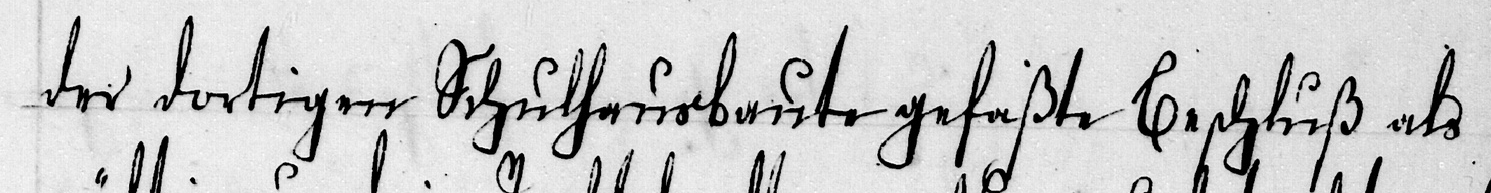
der dortigen Schulhausbaute gefaßte Beschluß als
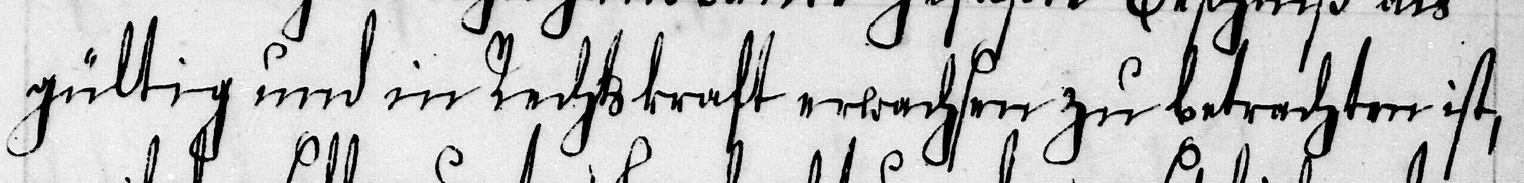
gültig und in Rechtskraft erwachsen zu betrachten ist,
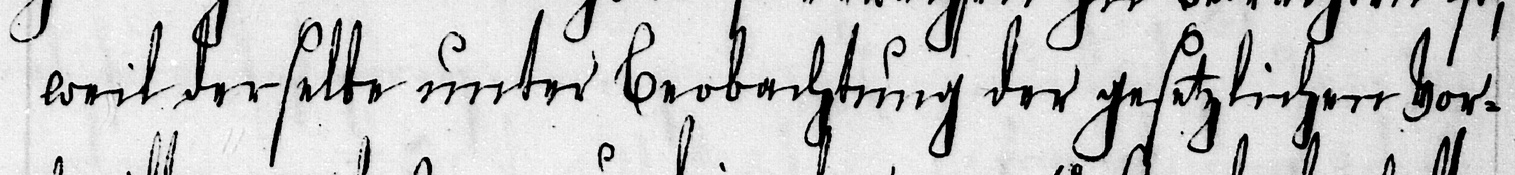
weil derselbe unter Beobachtung der gesetzlichen Vor¬
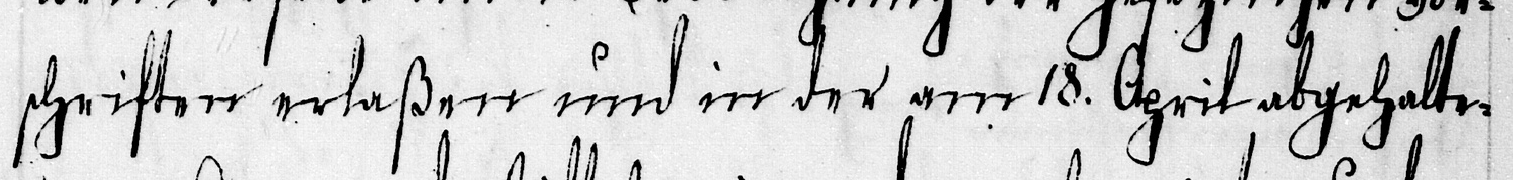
schriften erlaßen und in der am 18. April abgehalte¬
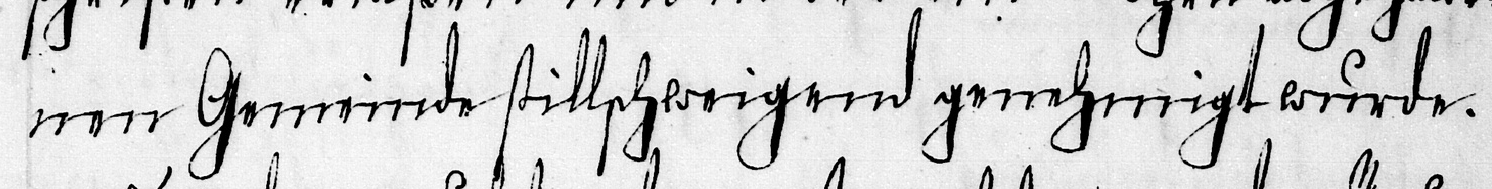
nen Gemeinde stillschweigend genehmigt wurde.
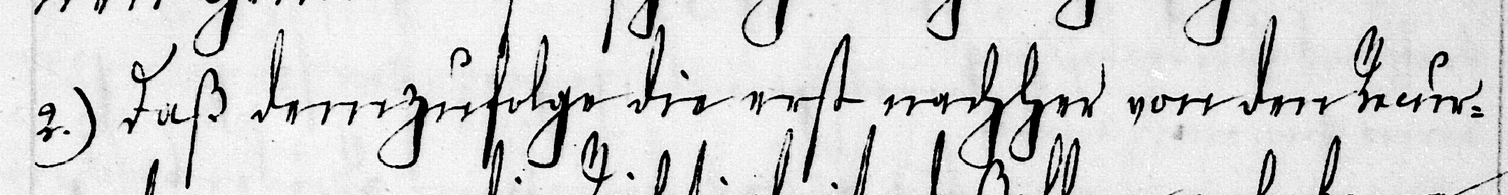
2.) Daß demzufolge die erst nachher von den Recur¬
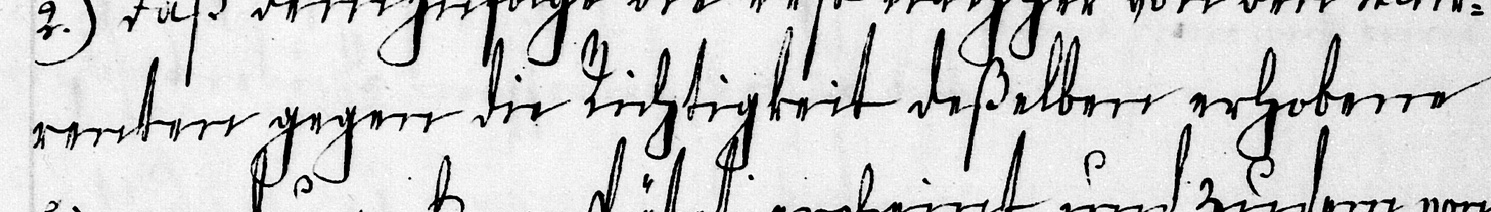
renten gegen die Richtigkeit deßelben erhobene
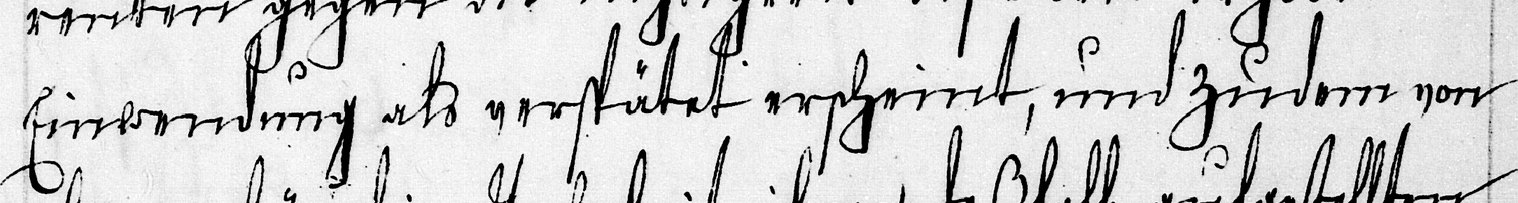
Einwendung als verspätet erscheint, und zudem von
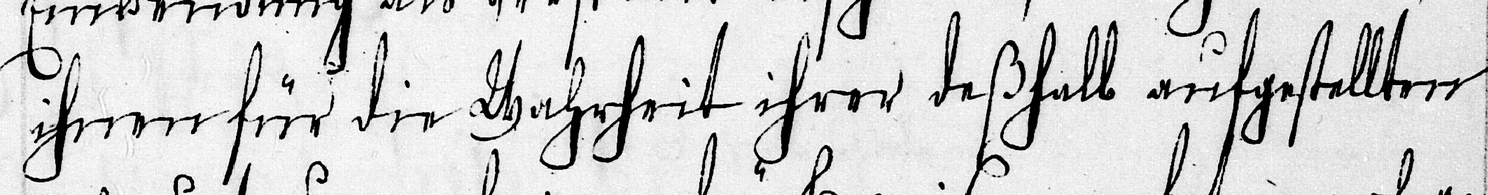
ihnen für die Wahrheit ihrer deßhalb aufgestellten
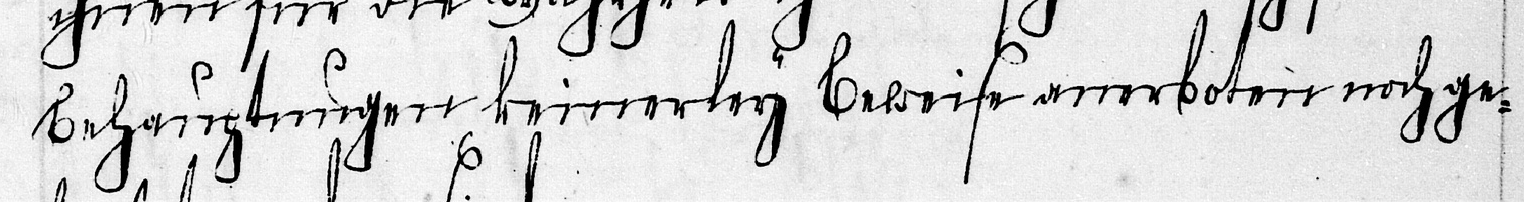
Behauptungen keinerley Beweise anerboten noch ge¬
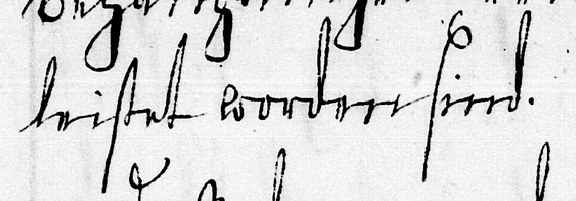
leistet worden sind.
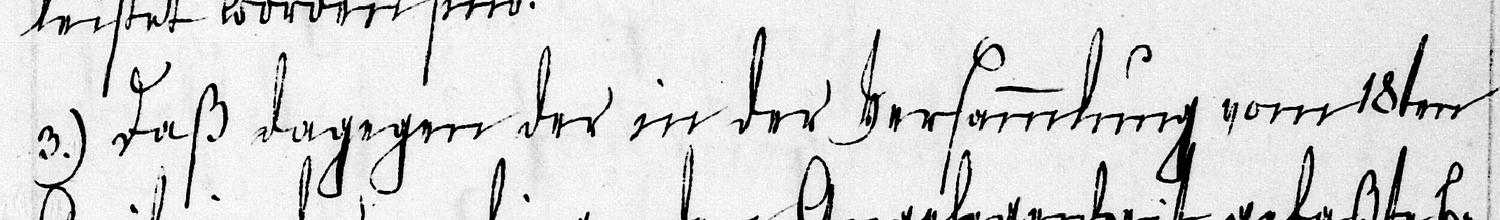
3.) Daß dagegen der in der Versammlung vom 18ten
